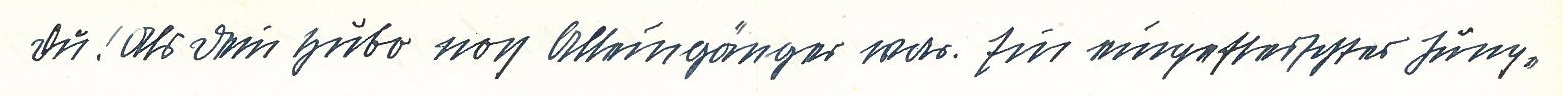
Du! Als Dein Hubo noch Alleingänger war. Ein eingefleischter Jung¬
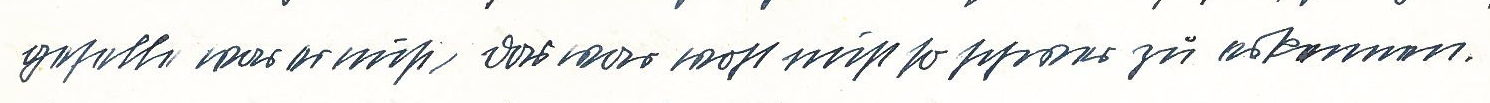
geselle war er nicht, das war wohl nicht so schwer zu erkennen.
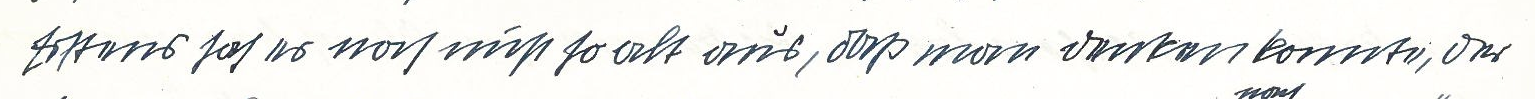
Erstens sah er noch nicht so alt aus, daß man denken konnte, der
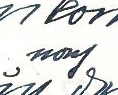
nach
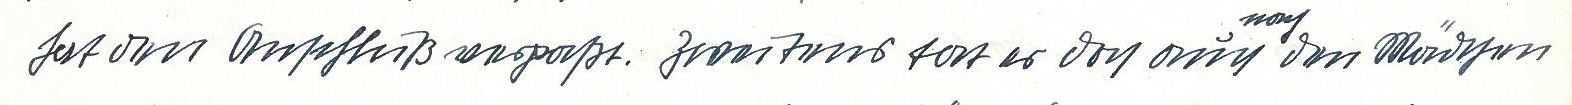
hat den Anschluß verpaßt. Zweitens tat er doch auch den Mädchen
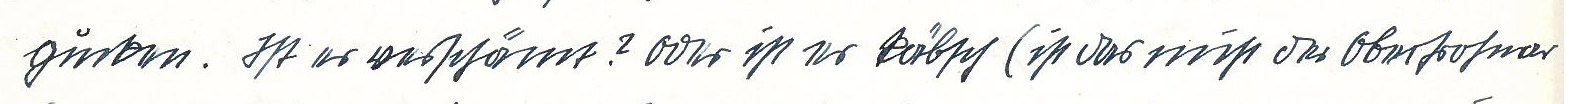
gucken. Ist er verschämt? Oder ist er käbsch (ist das nicht der O.er
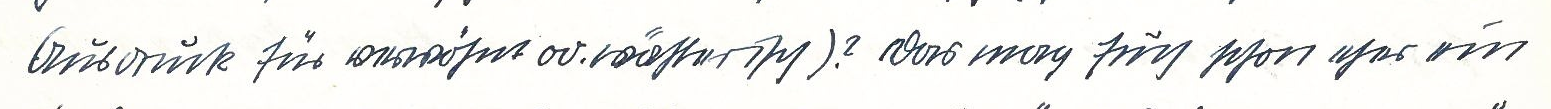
Ausdruck für verwöhnt oder wählerisch)? Das mag Euch schon eher ein
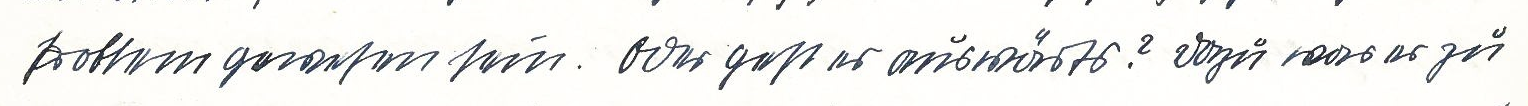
Problem gewesen sein. Oder geht er auswärts? Dazu war er zu
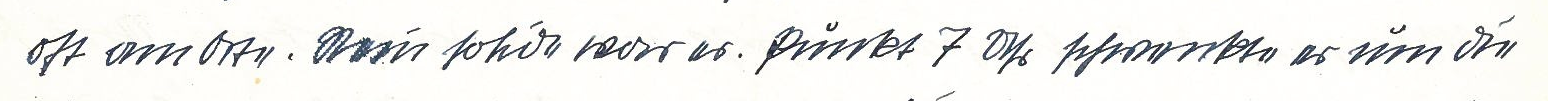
oft am Orte. Nein solide war er. Punkt 7 Uhr schwenkte er um die
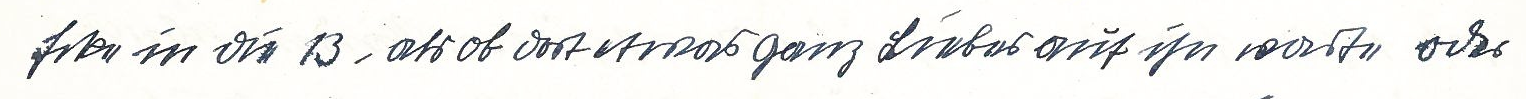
Ecke in die 13, als ob dort etwas ganz Liebes auf ihn warte oder
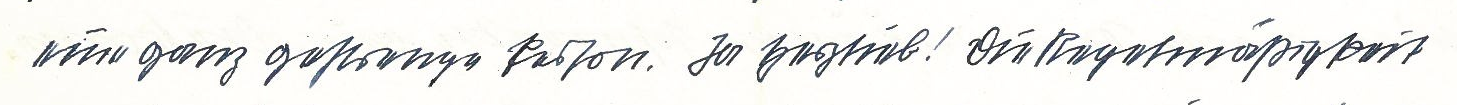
eine ganz gestrenge Person. Ja Herzlieb! Die Regelmäßigkeit
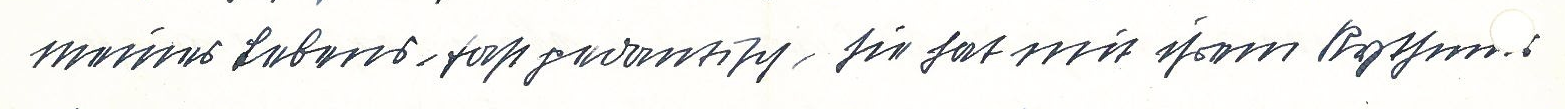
meines Lebens, fast pedantisch, sie hat mit ihrem Rythmus
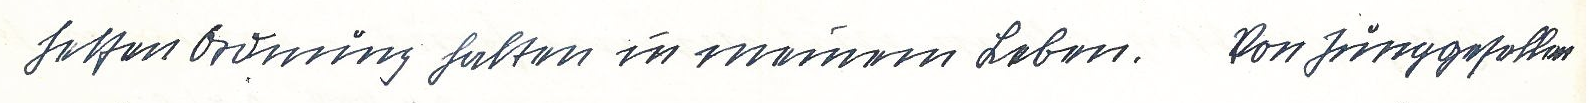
helfen Ordnung halten in meinem Leben. Von Junggesellen
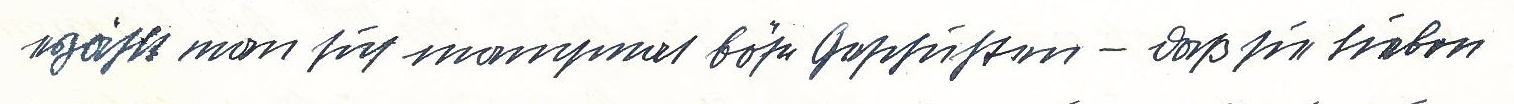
erzählt man sich manchmal böse Geschichten – daß sie lieben
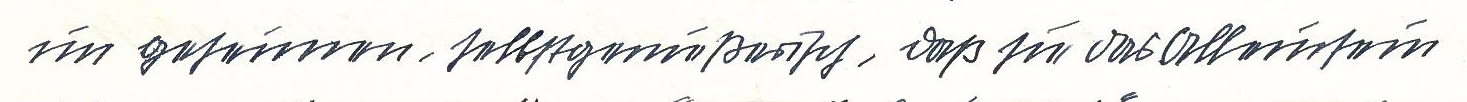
im geheimen, selbstgenießerisch, daß sie das Alleinsein
